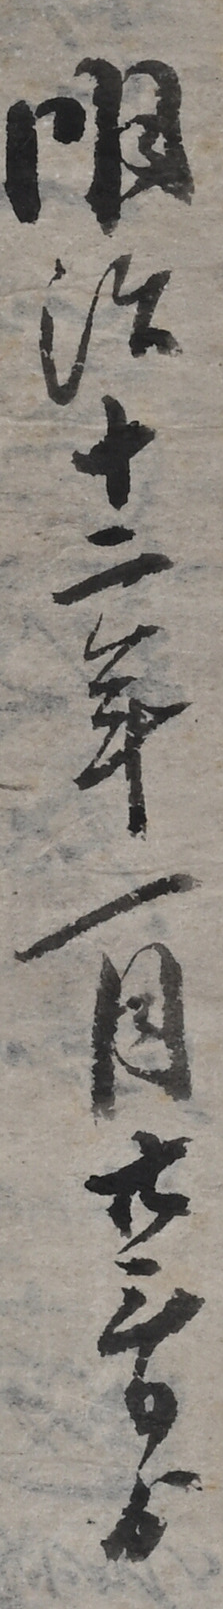明治十二年一月廿三日ゟ
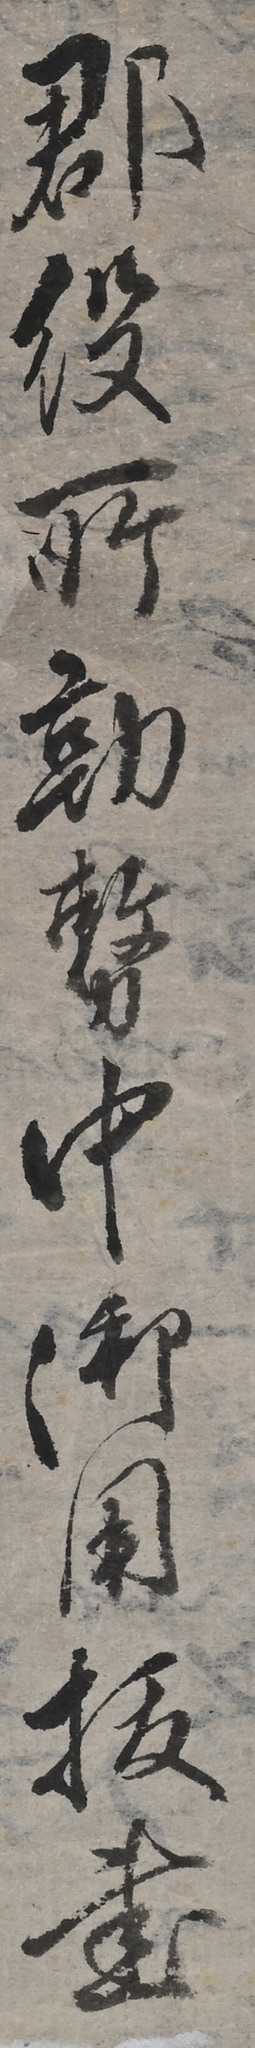郡役所勤務中御用抜書
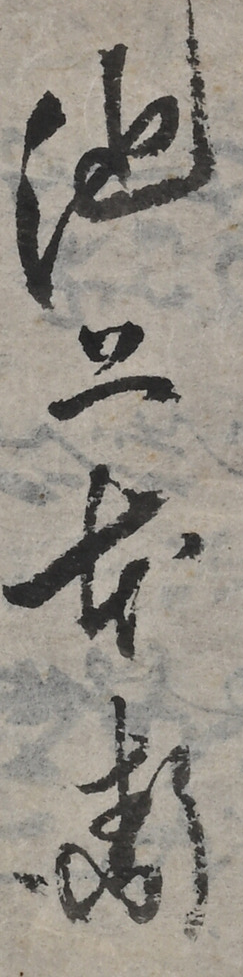池上本衛

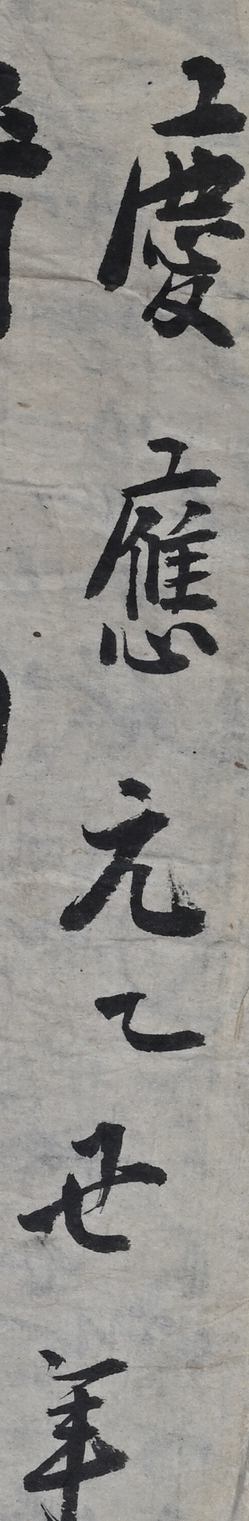慶応元乙丑年
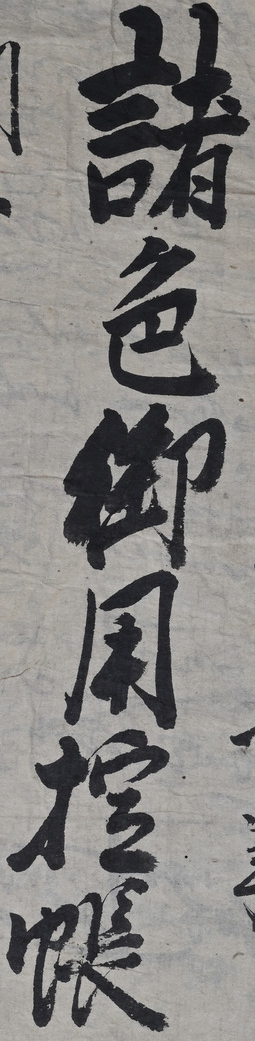諸色御用控張
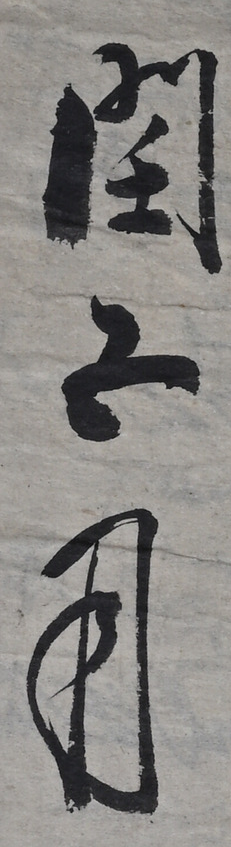閏五月
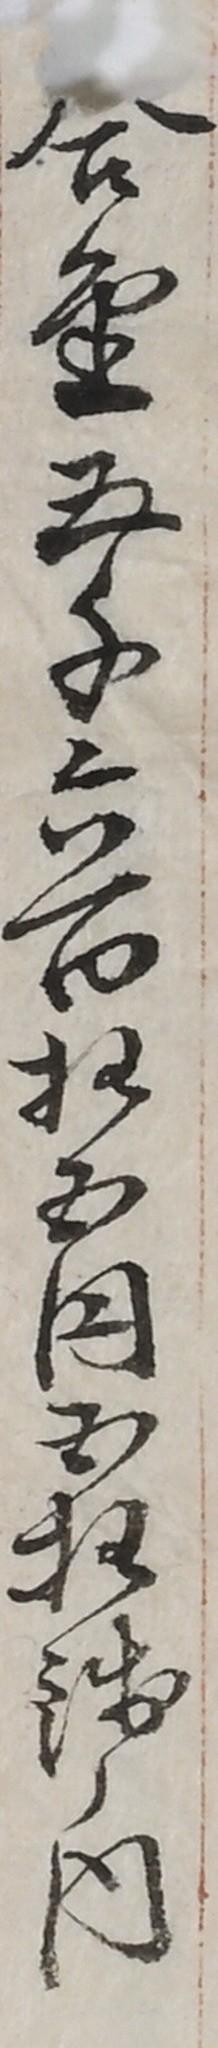合金五千六百拾五円五拾銭之内
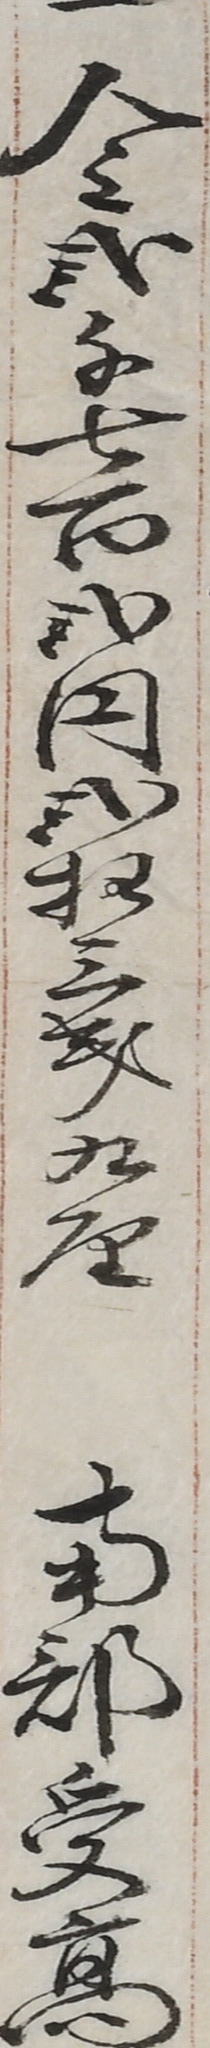一金弐千七百弐円弐拾三戔九厘南部受高
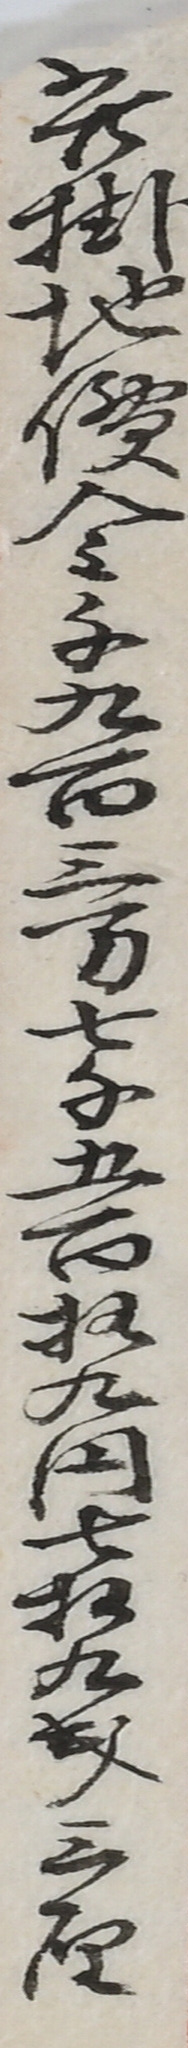此掛地価金千九百三万七千五百拾九円七拾九銭三厘
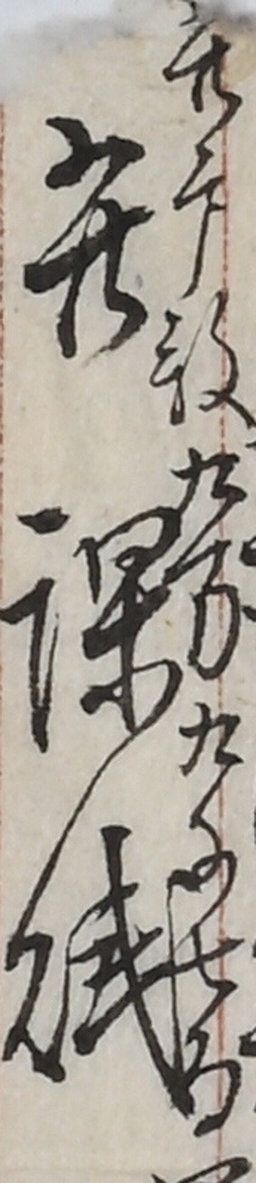此課賦
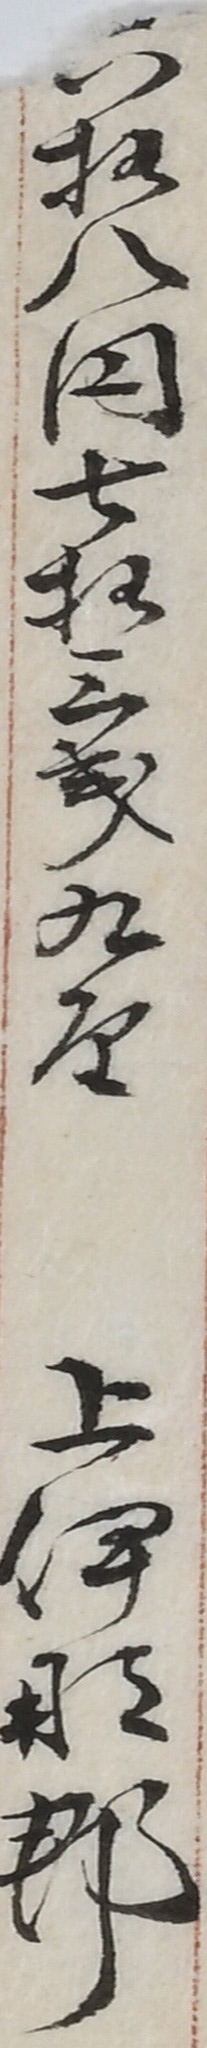六拾八円七拾三銭九厘上伊那郡

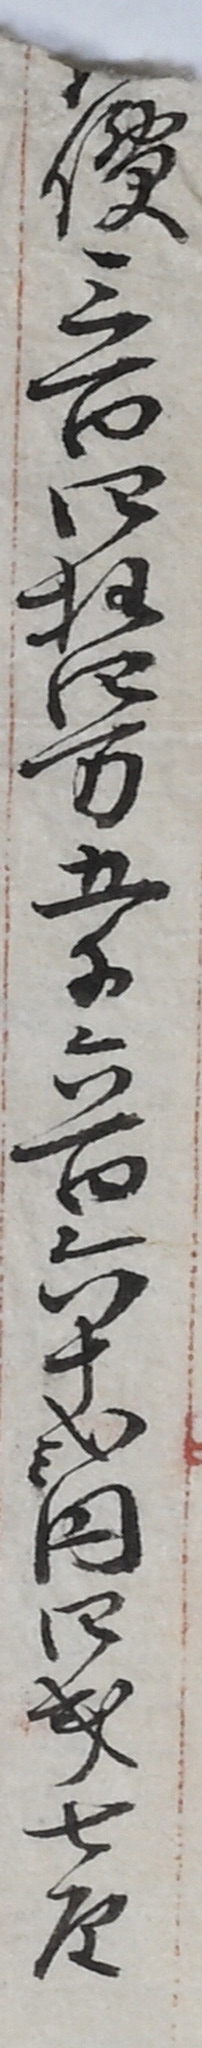価三百四拾四万五千六百六十弐円四銭七厘
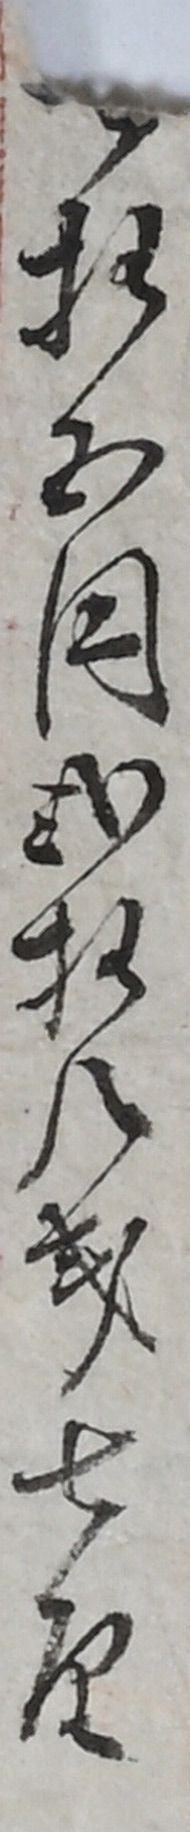拾五円弐拾八銭七厘
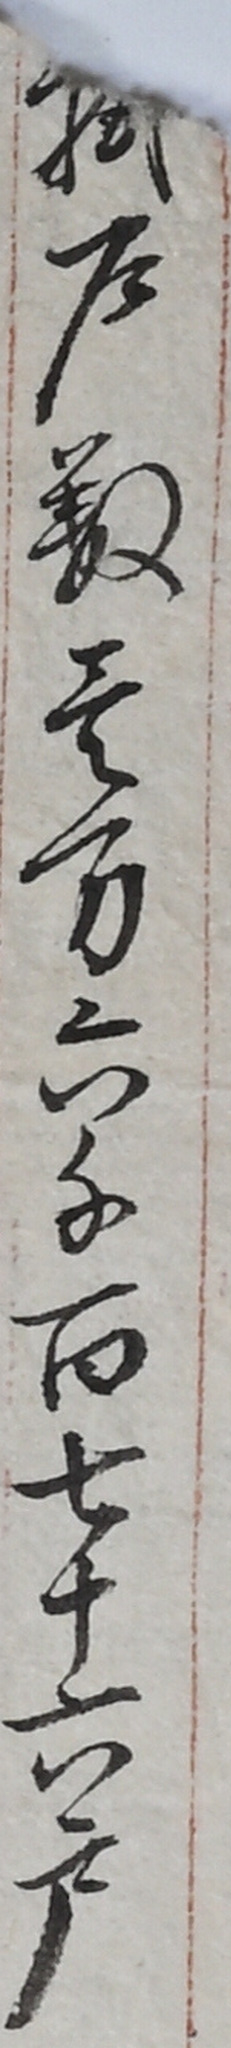掛戸数壱万六千百七十六戸
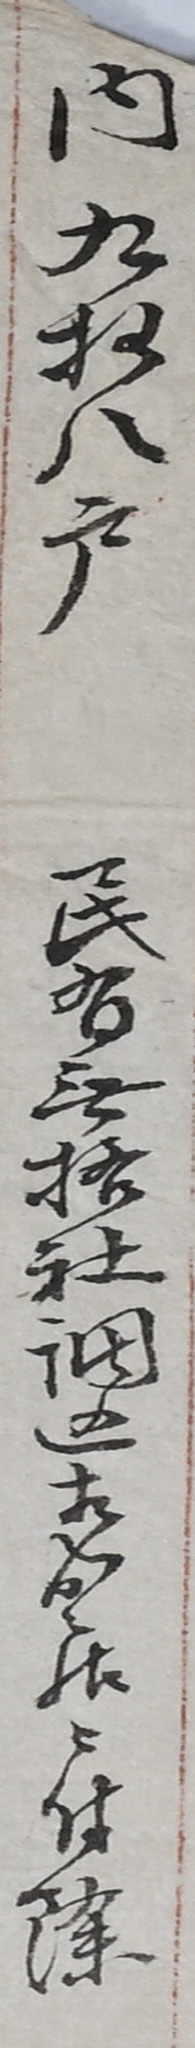内九拾八戸民有無格社調込相成候居ニ付除
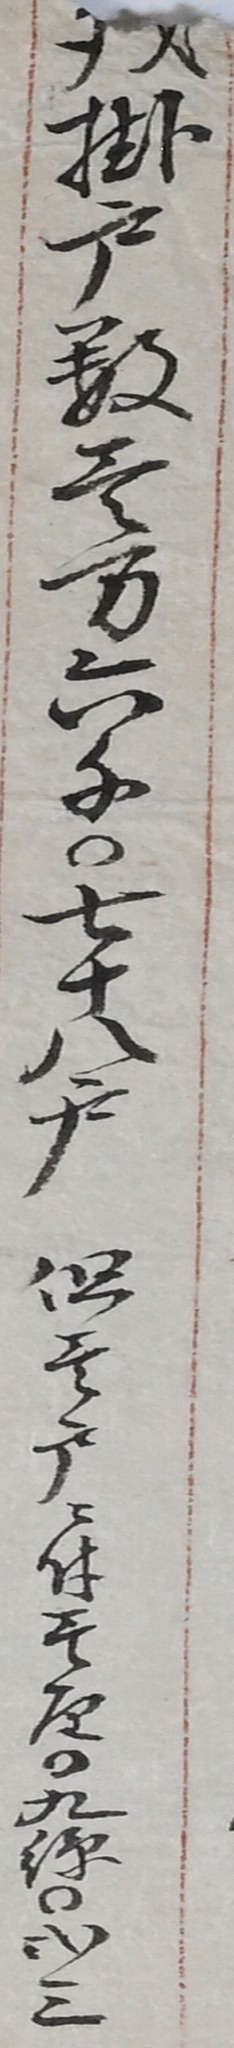残掛戸数壱万六千〇七十八戸但其戸ニ付壱厘〇九糸弐三
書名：郡役所勤務中御用抜書
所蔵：伊那市立高遠町図書館・合同会社AMANE
